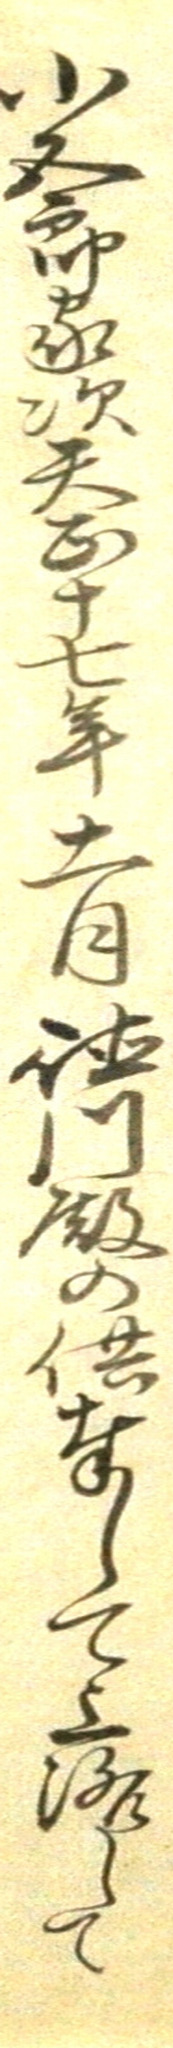小五郎家次天正十七年十一月徳川殿の供奉して上洛して
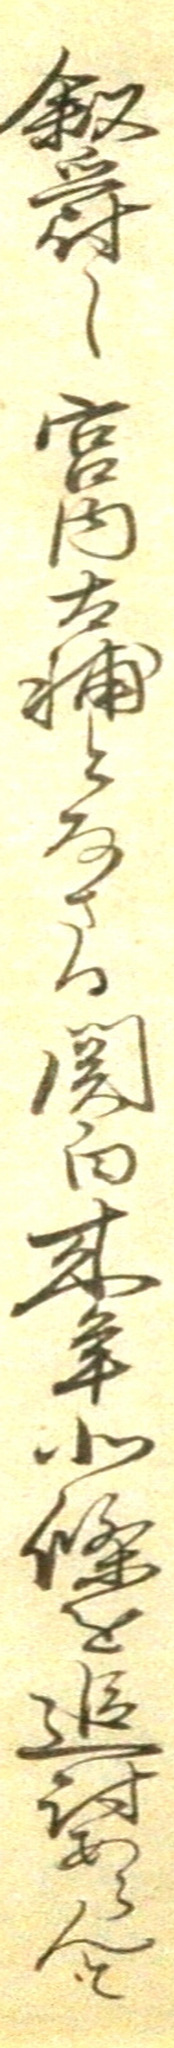叙爵し宮内太輔となさる関白来年北条を追討あらんと
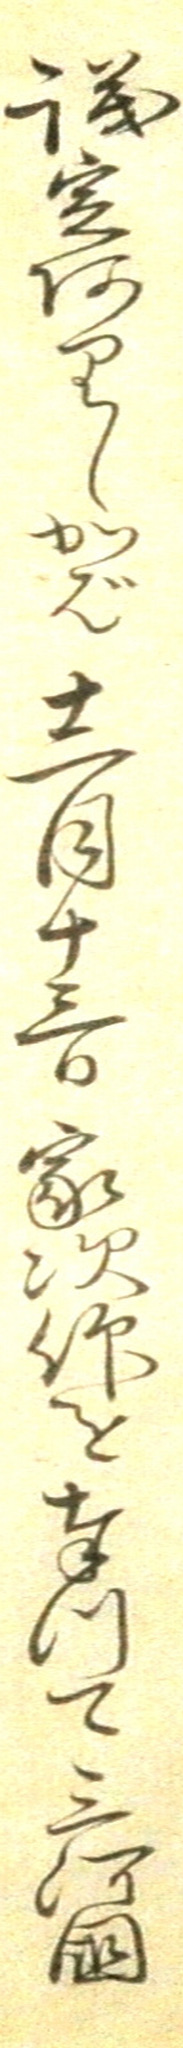議定ありしかば十二月十三日家次仰を奉つて三河国
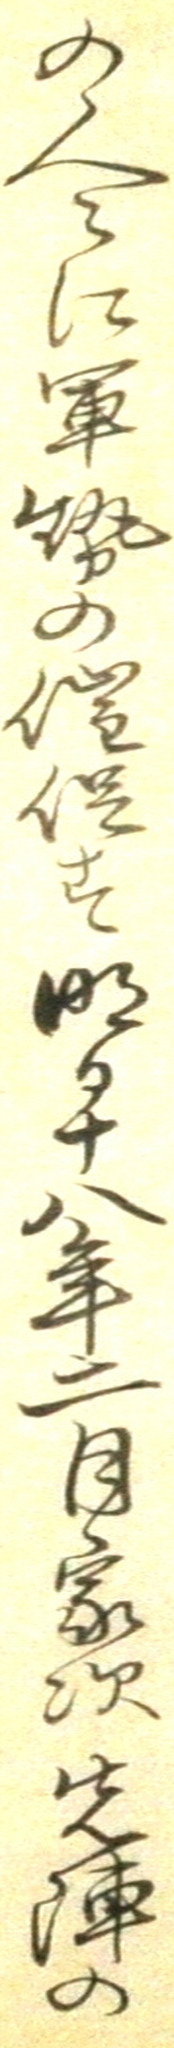の人々に軍勢の催促す明る十八年二月家次先陣の
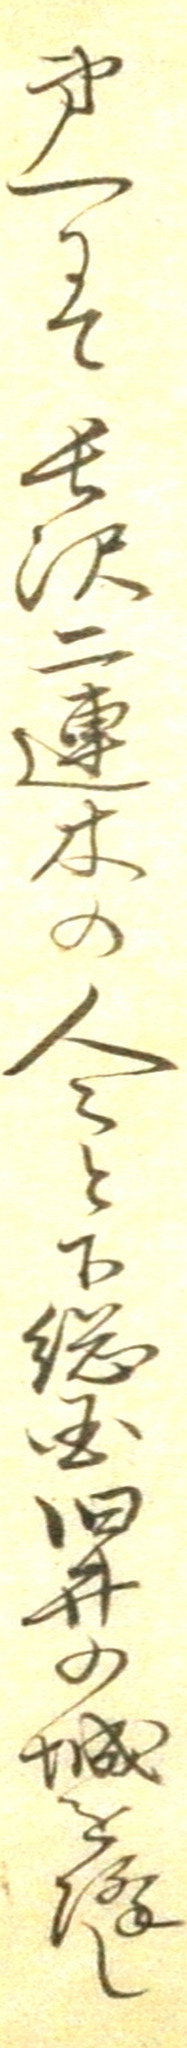第一にて長沢二連木の人々と下総国臼井の城を降し
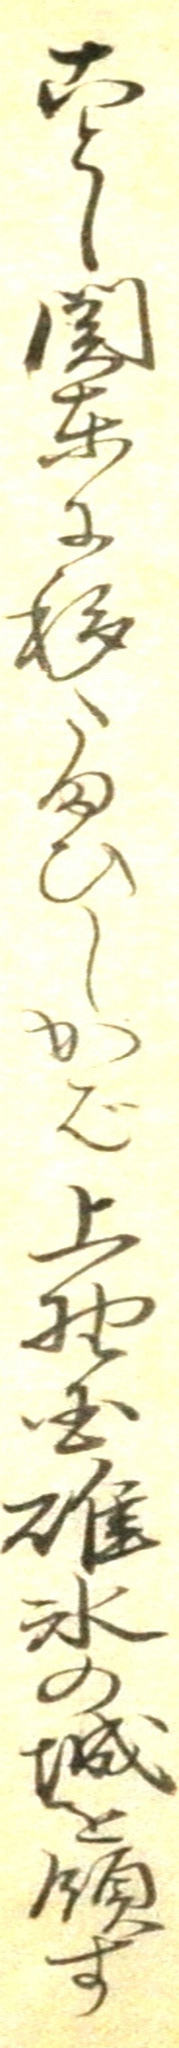ことし関東に移たまひしかば上野国碓氷の城を領す
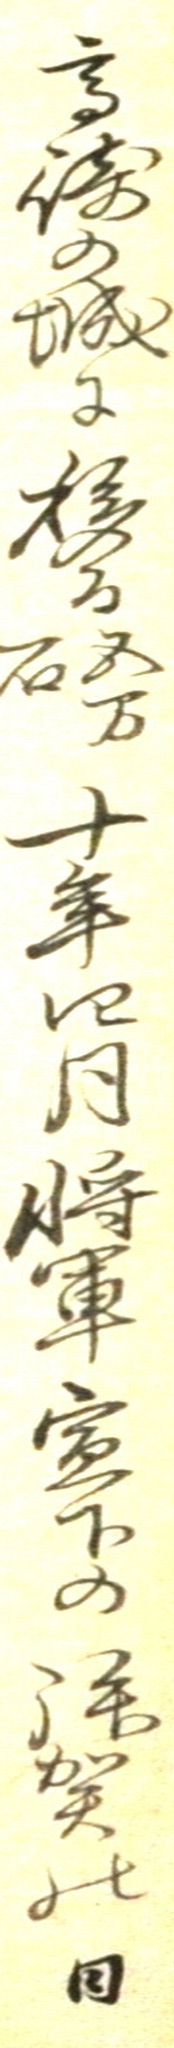高崎の城に移る五万石十年四月将軍宣下の拝賀の日
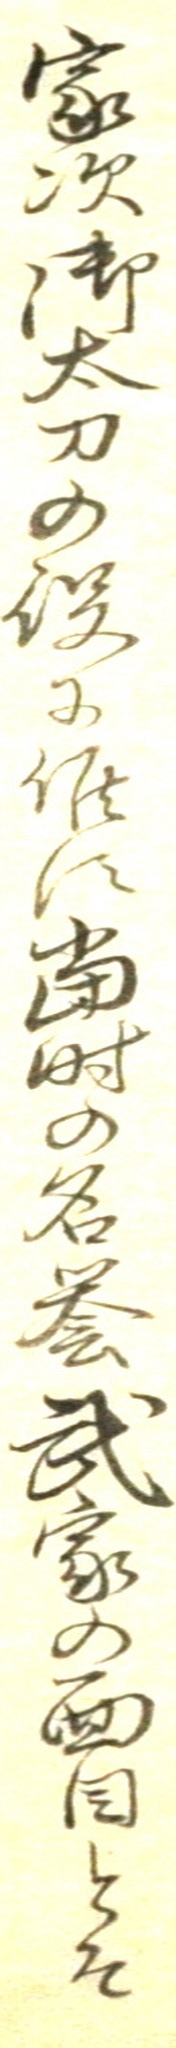家次御太刀の役に推す当時の名誉武家の面目とそ
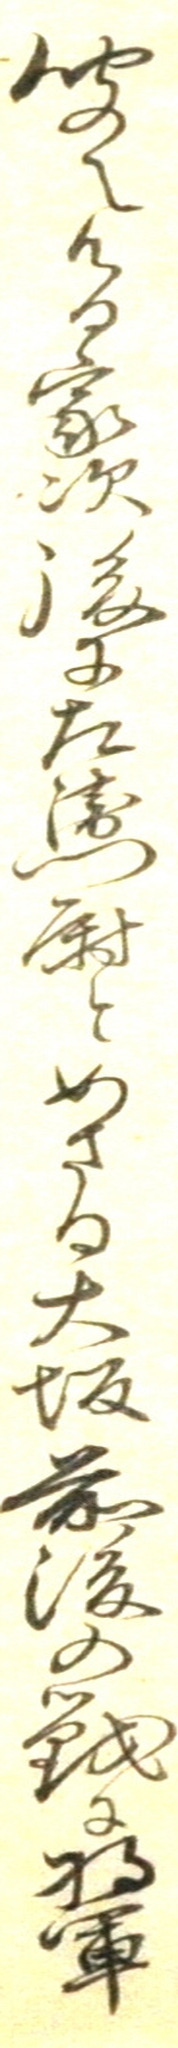聞えける家次後に左衛門尉とめさる大坂前後の戦に将軍
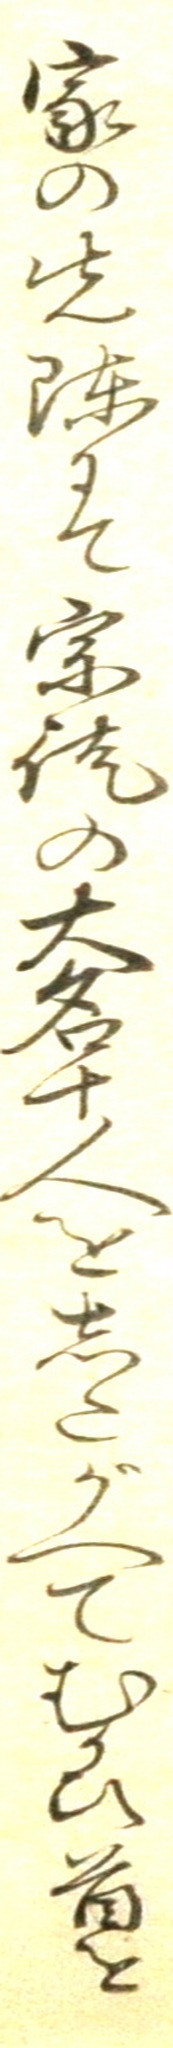家の先陣にて宗徒の大名十人をしたがへてむかひ首を
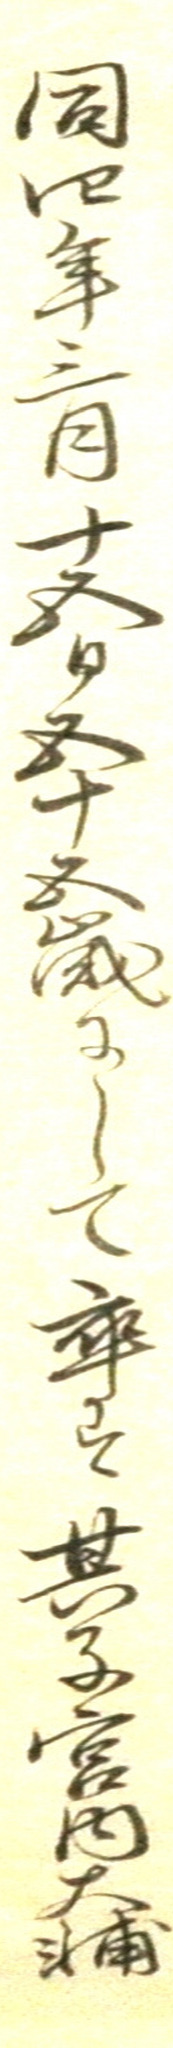同四年三月十五日五十五歳にして卒す其子宮内大輔
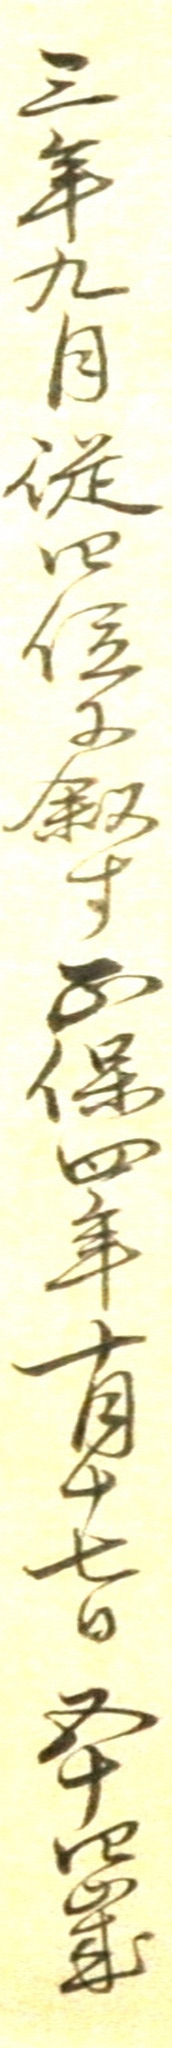三年九月従四位に叙す正保四年十月十七日五十四歳
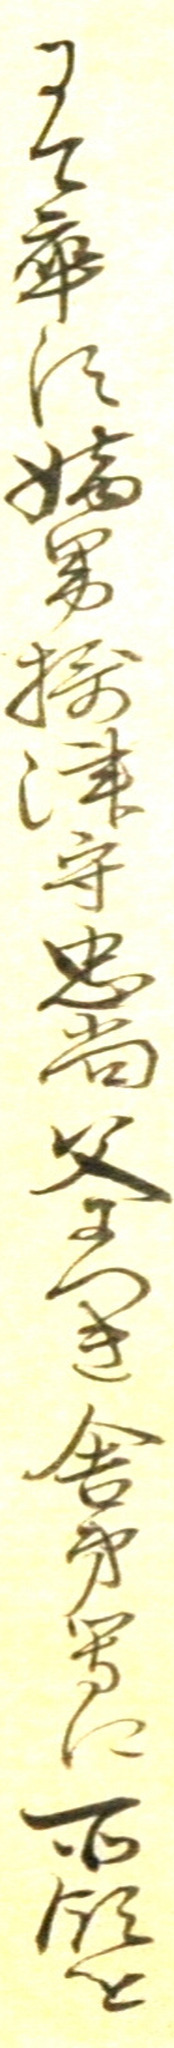にて卒す嫡男摂津守忠尚父につき舎弟等に所領を

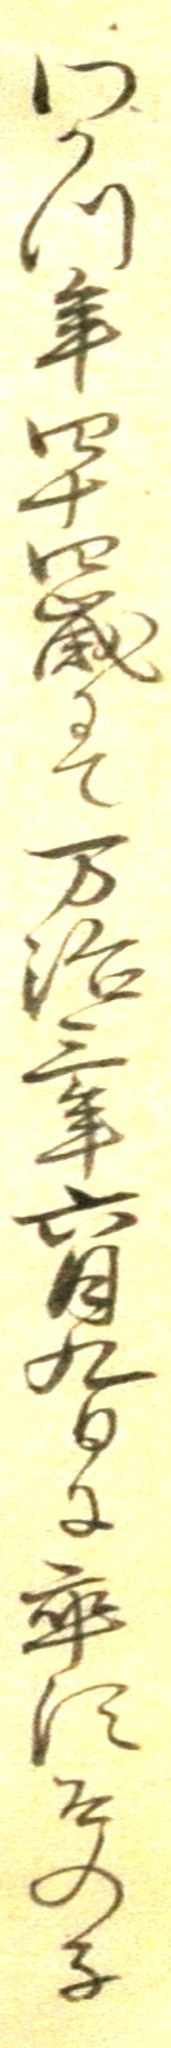わかつ年四十四歳にて万治三年六月九日に卒すその子
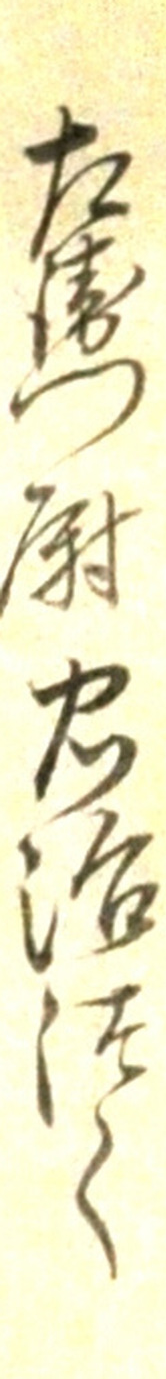左衛門尉忠治つく
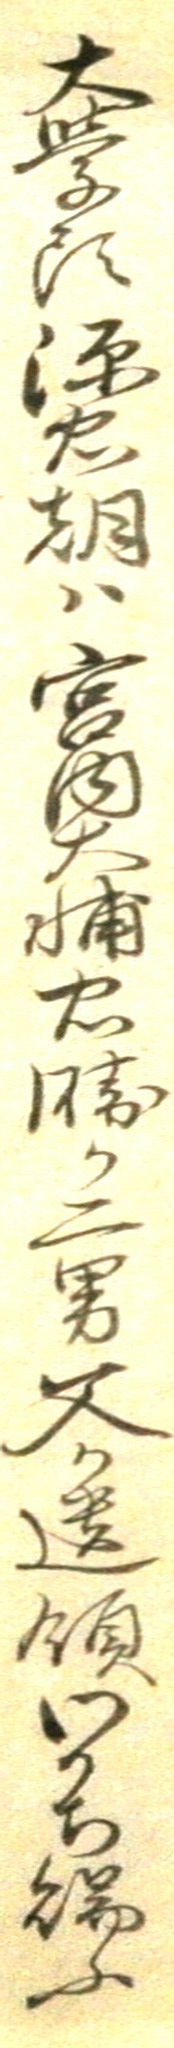大学頭源忠朝は宮内大輔忠勝か二男父か遺領わかち賜ふ
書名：藩翰譜（四・上）
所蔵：伊那市立高遠町図書館・合同会社AMANE
